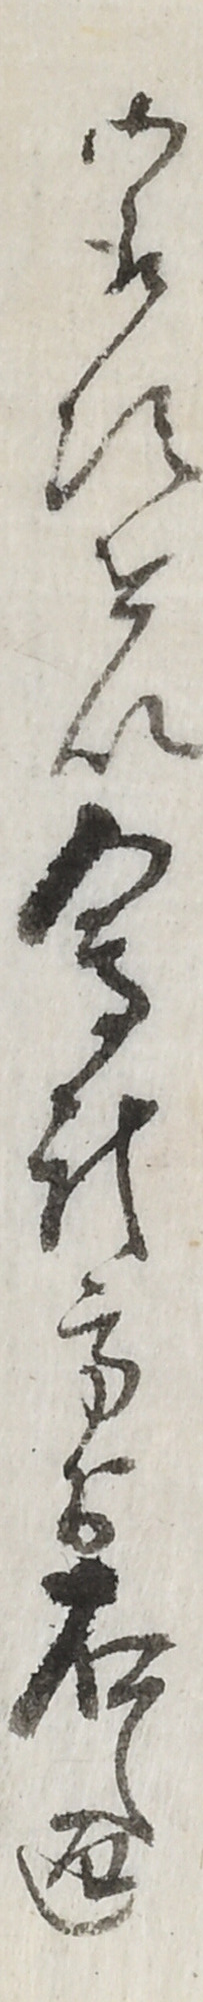御取次を以会計方ゟ右之通
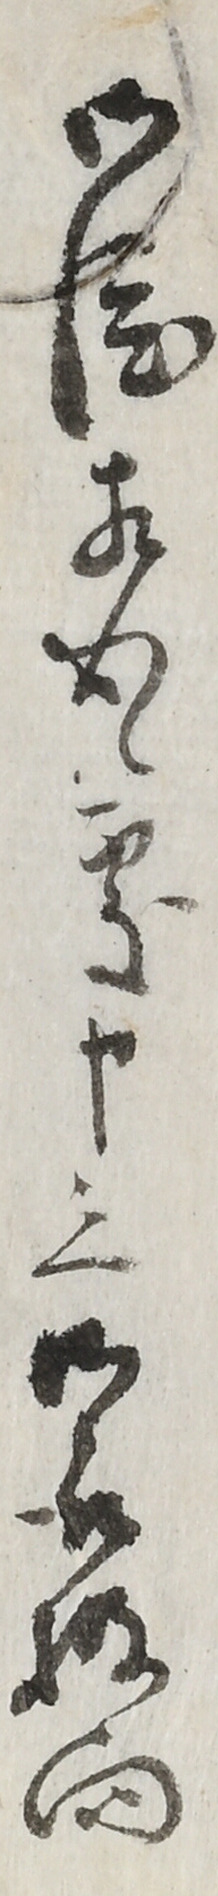御渡相成候処申上御取扱向

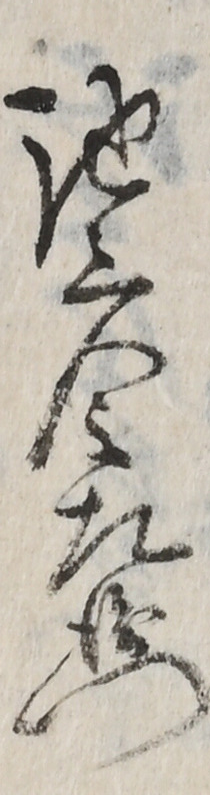池上金左衛門
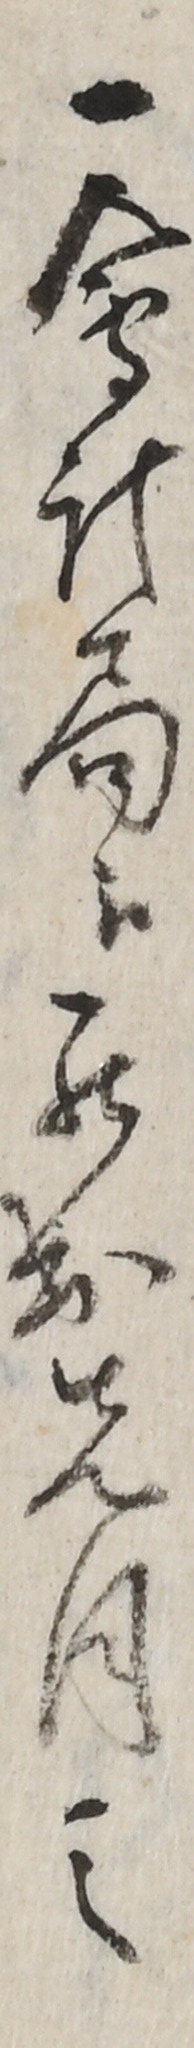一会計局江罷出先月之
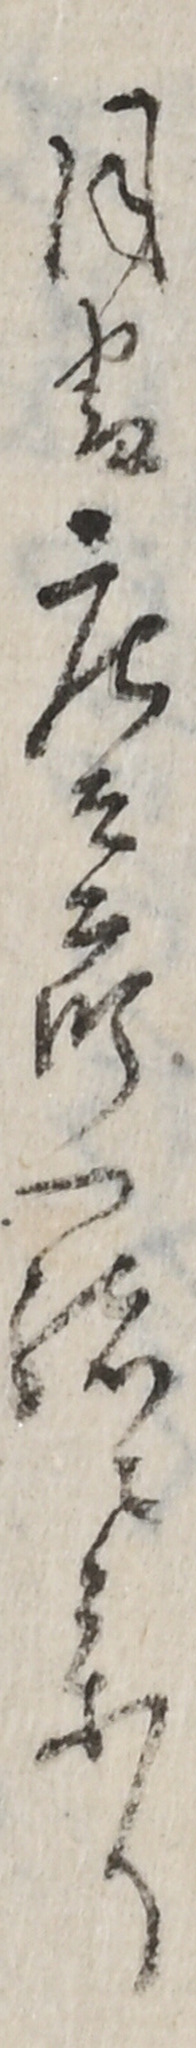月番庄太郎一緒ニ参り
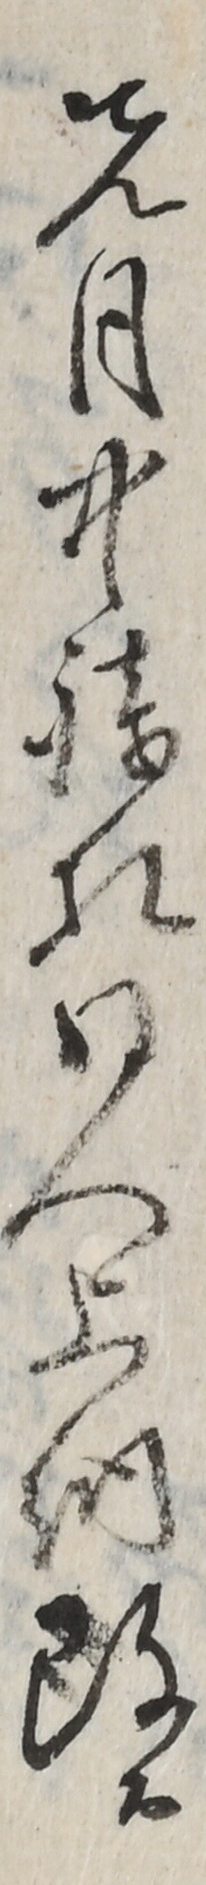先月中請札同人上納改而
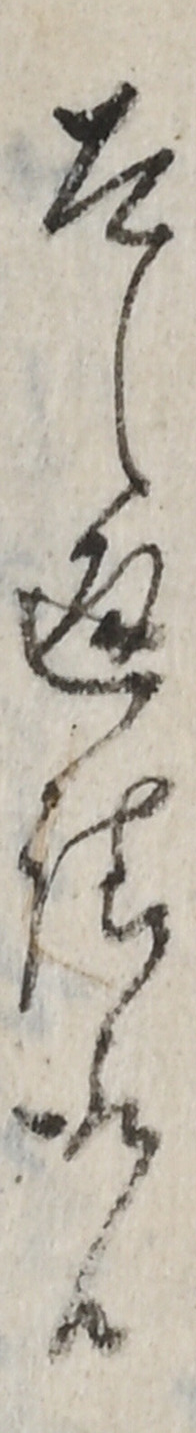左之通請取候
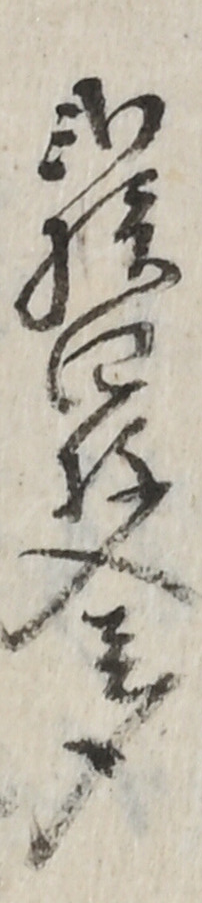弐拾四枚入壱〆
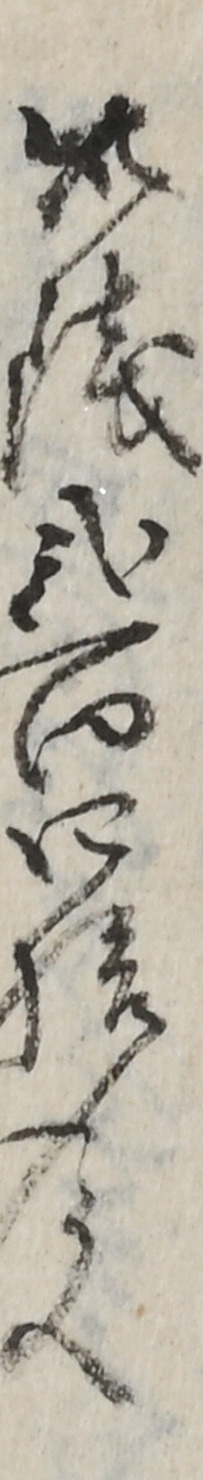此銭弐百四拾〆文

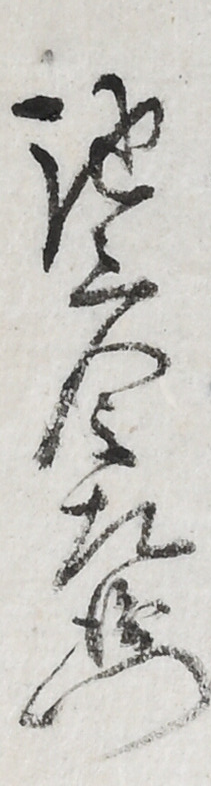池上金左衛門
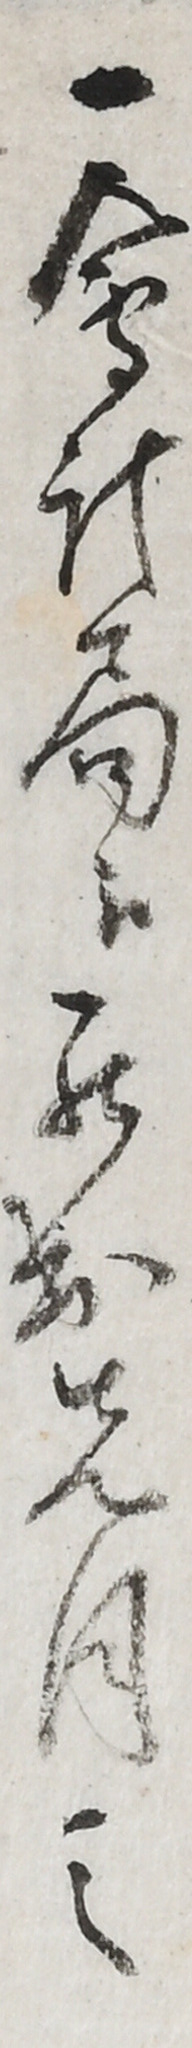一会計局江罷出先月之
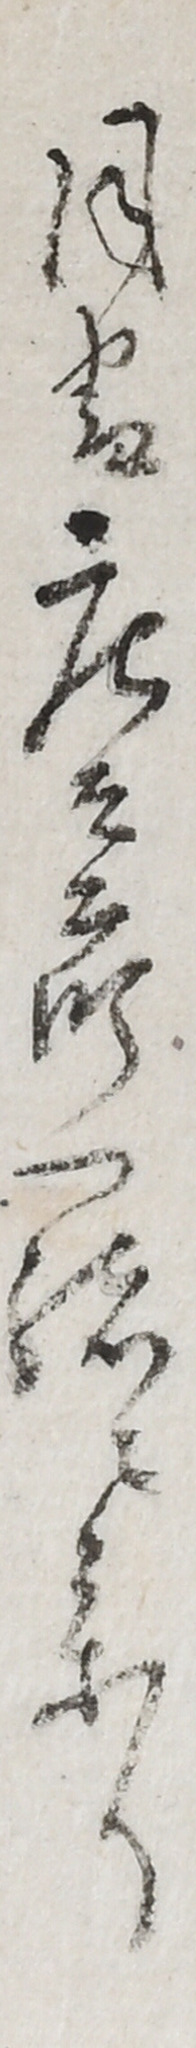月番庄太郎一緒ニ参り
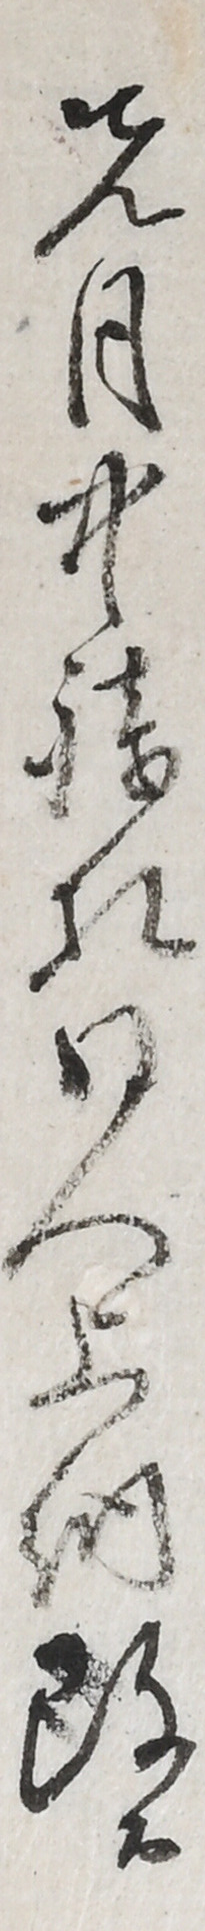先月中請札同人上納改而
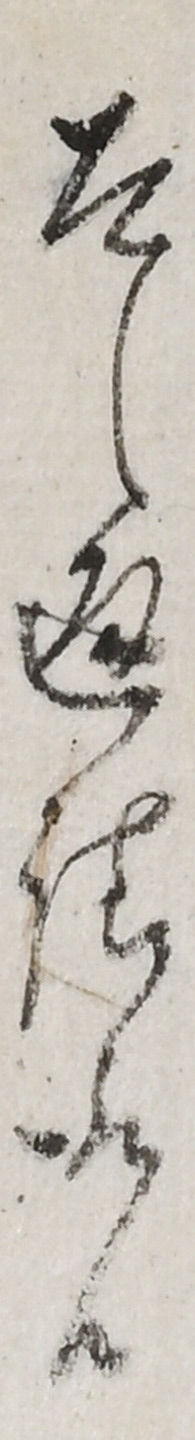左之通請取候
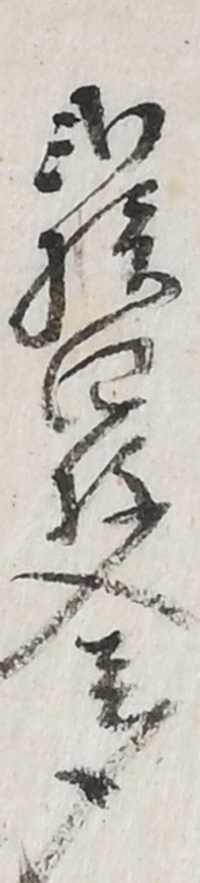弐拾四枚入壱〆
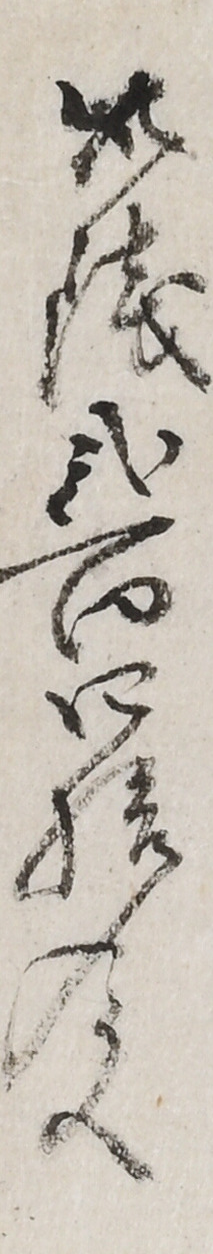此銭弐百四拾〆文
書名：信濃全國楮幣引換御用控
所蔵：伊那市立高遠町図書館・合同会社AMANE
